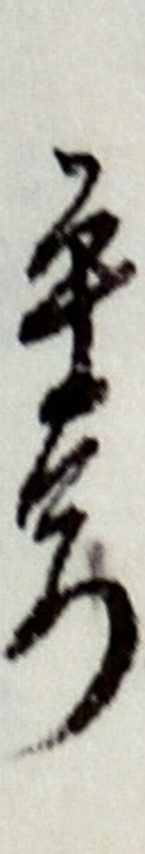平右衛門
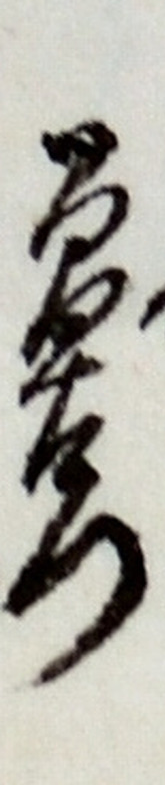曾右衛門
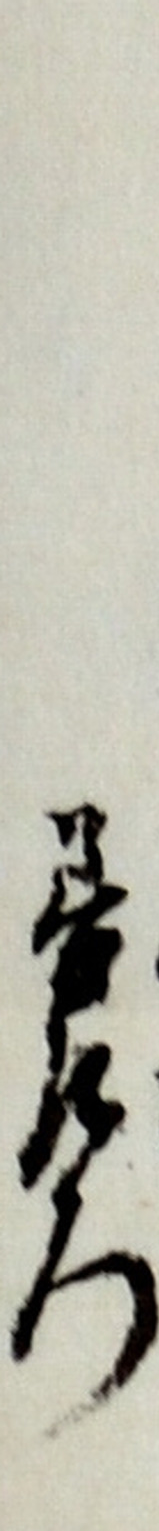善左衛門
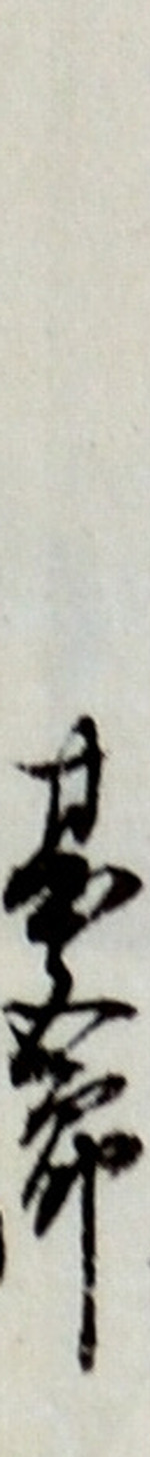甚五郎
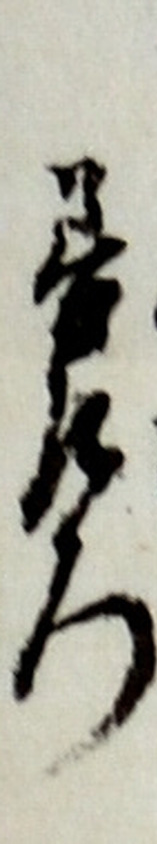善左衛門
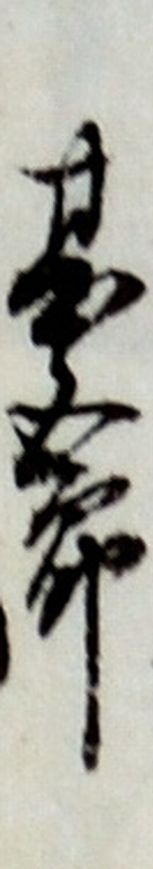甚五郎
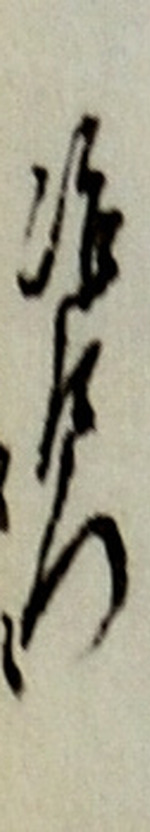治左衛門
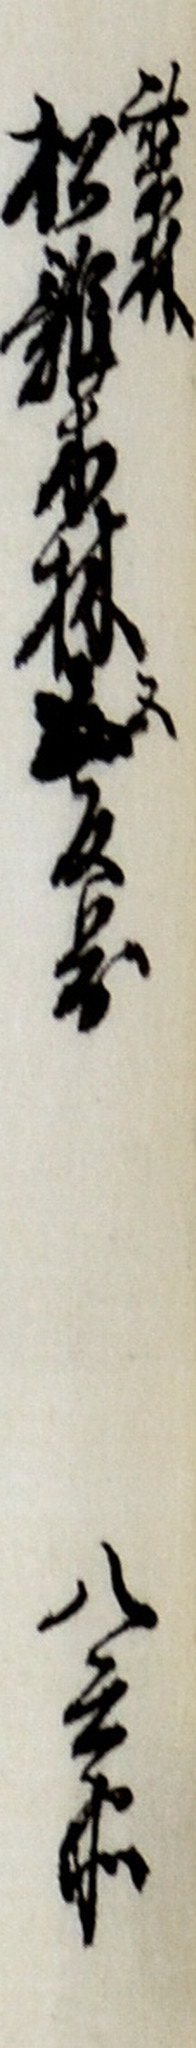雑木林壱反歩利兵衛
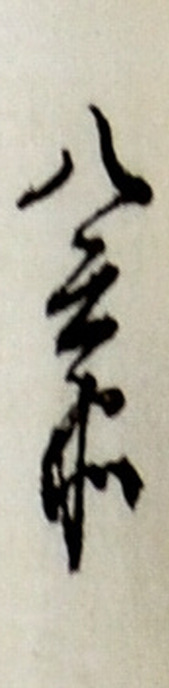利兵衛
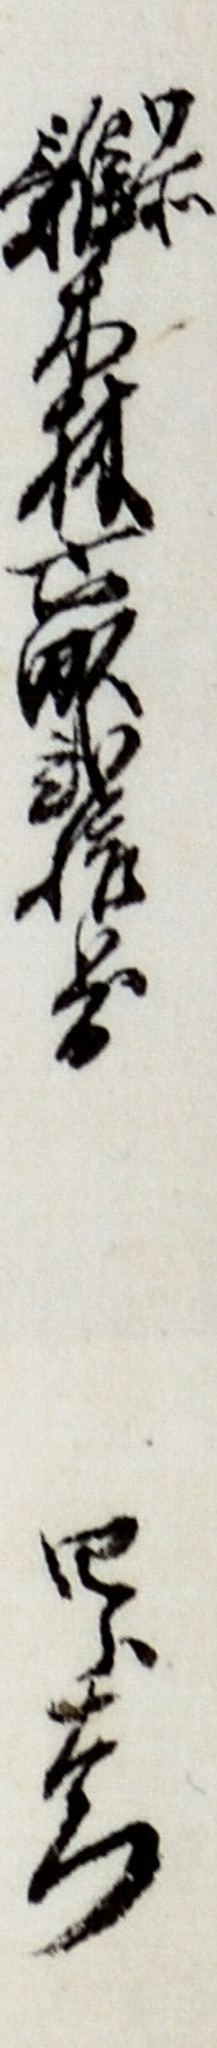雑木林六畝弐拾歩四郎右衛門
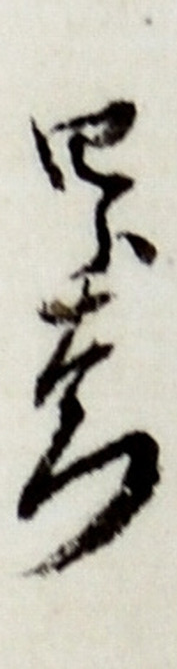五郎右衛門
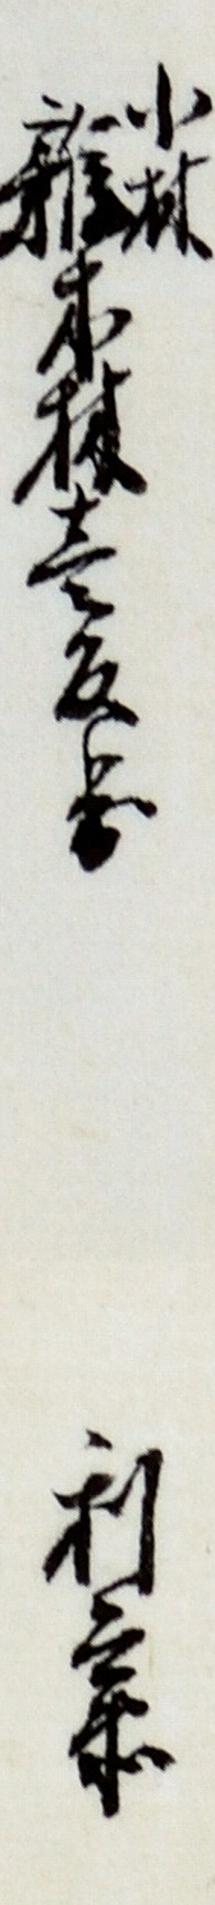雑木林壱反歩利兵衛
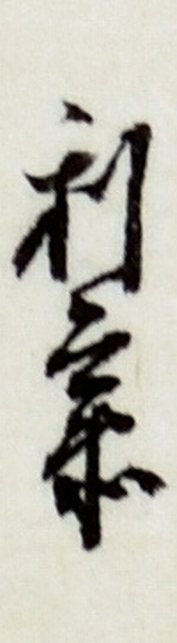利兵衛
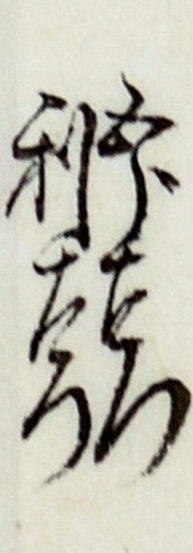曾右衛門
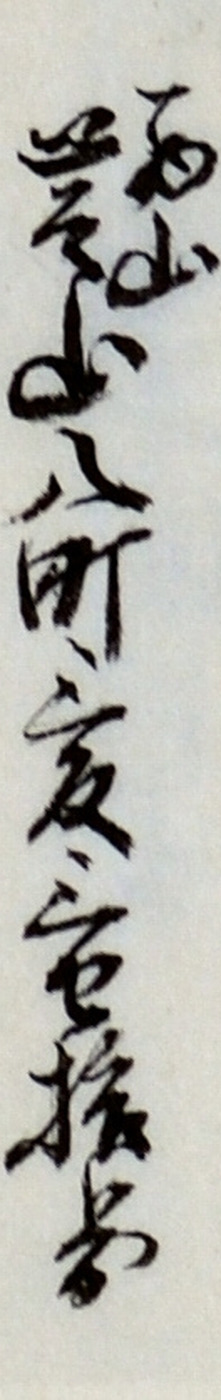芝山八町三反三セ拾歩村中
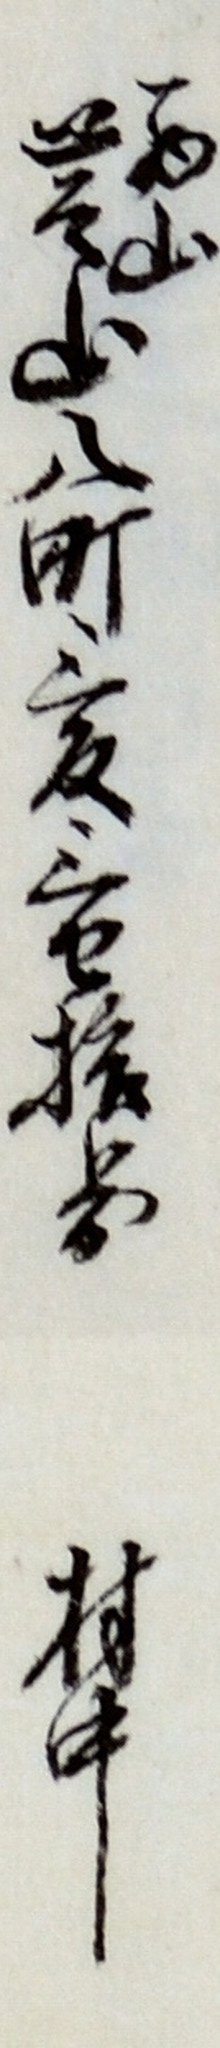芝山八町三反三セ拾歩村中
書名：御領分中山林社地手控
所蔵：伊那市立高遠町図書館・合同会社AMANE
